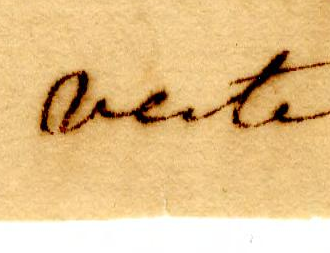vente
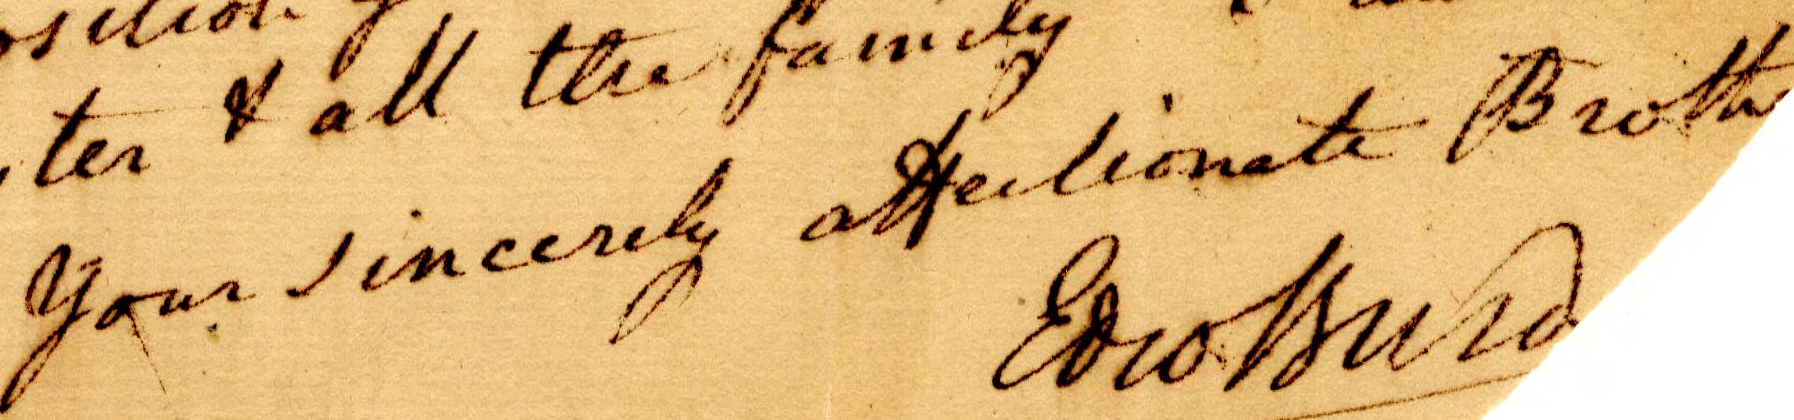Your sincerely affectionate Broth-
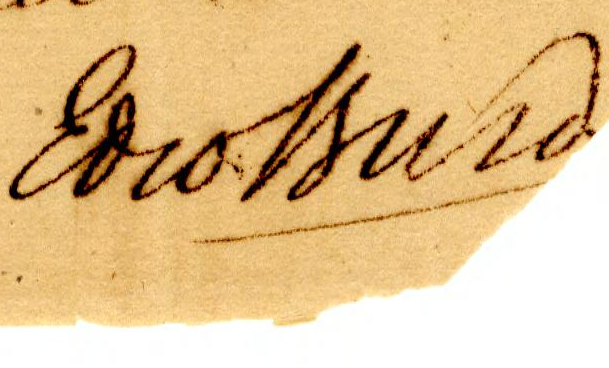Edw. Burd
